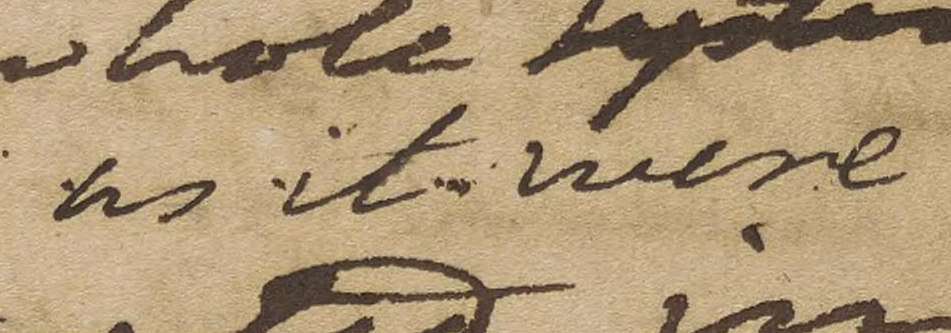as it were
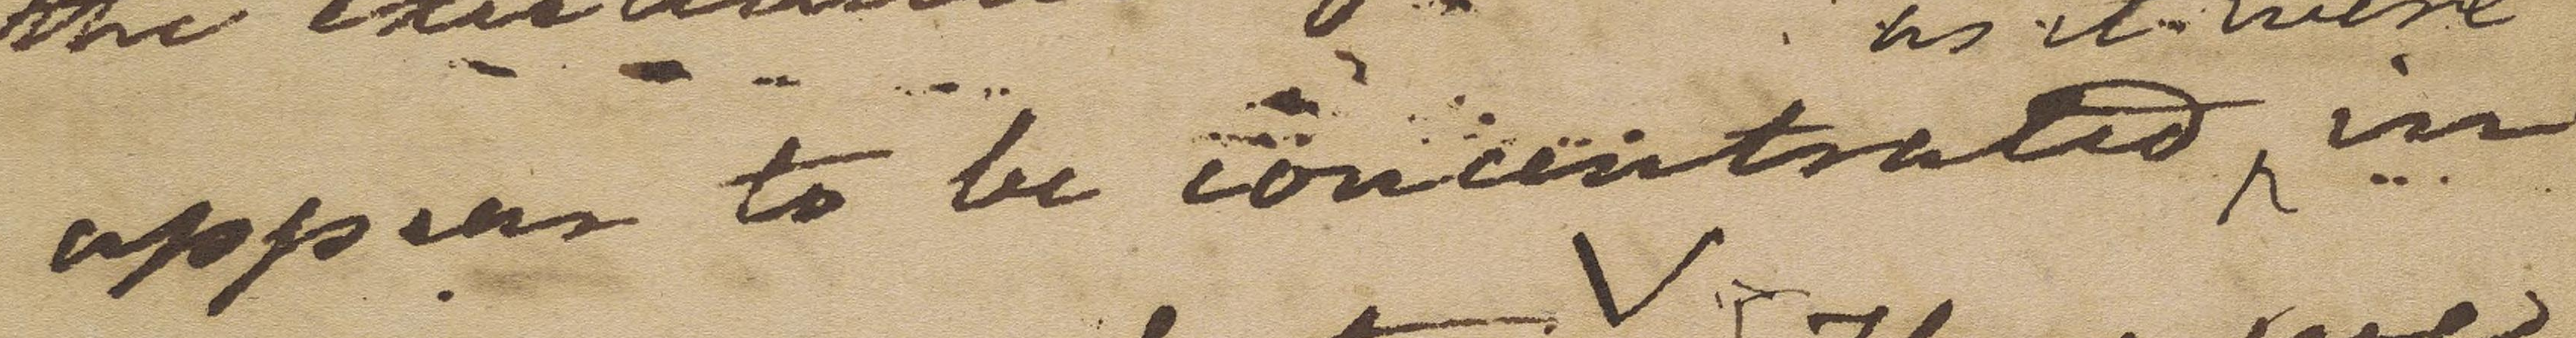appear to be concentrated ^ in
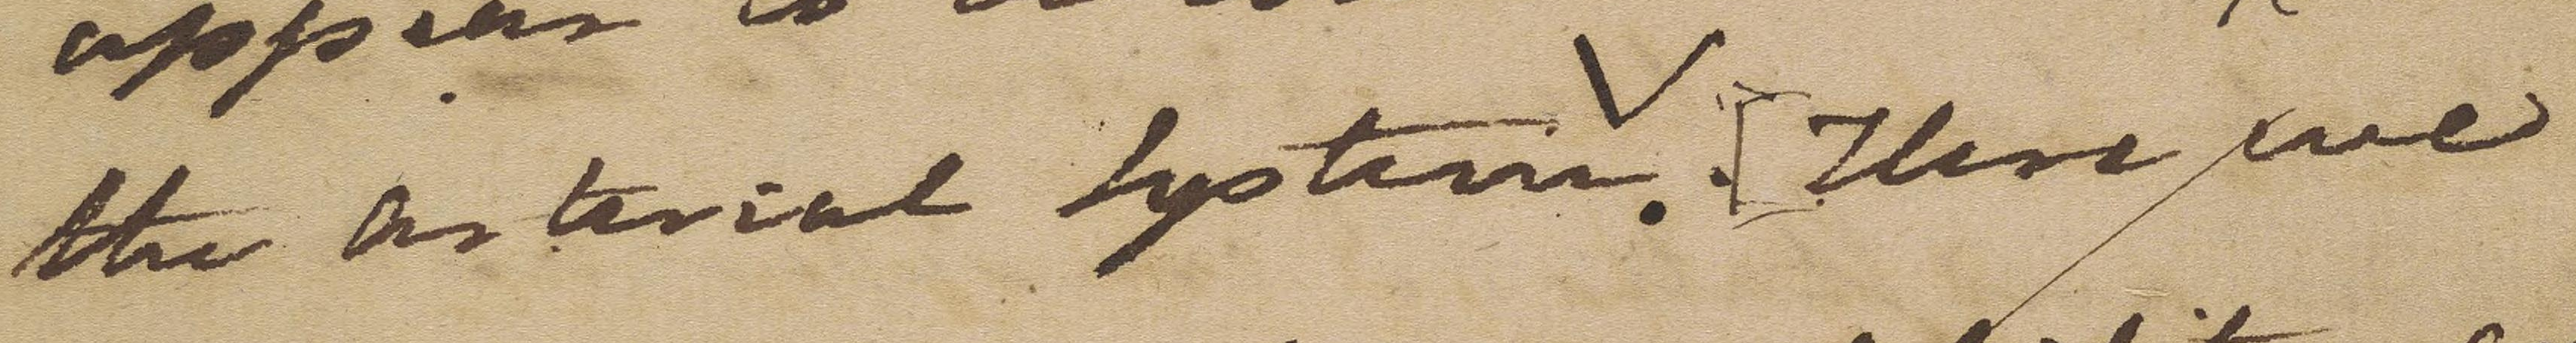the arterial system. (Here we
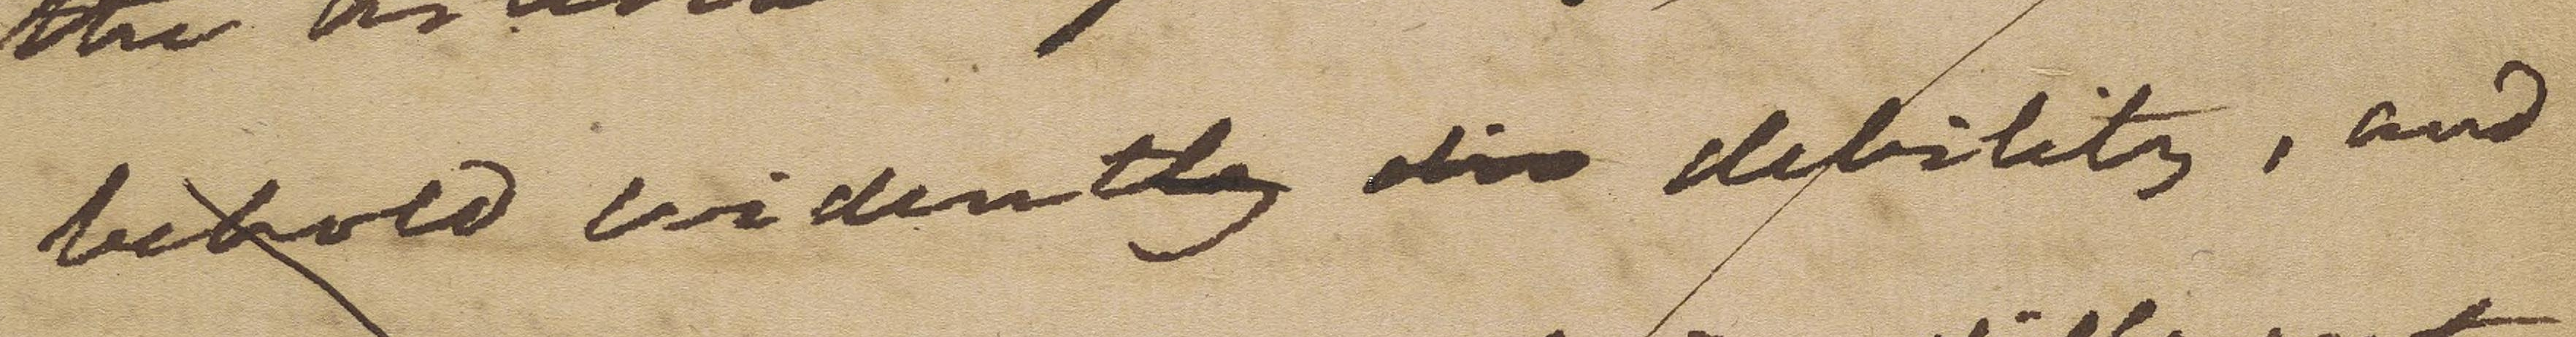behold evidently debility, and
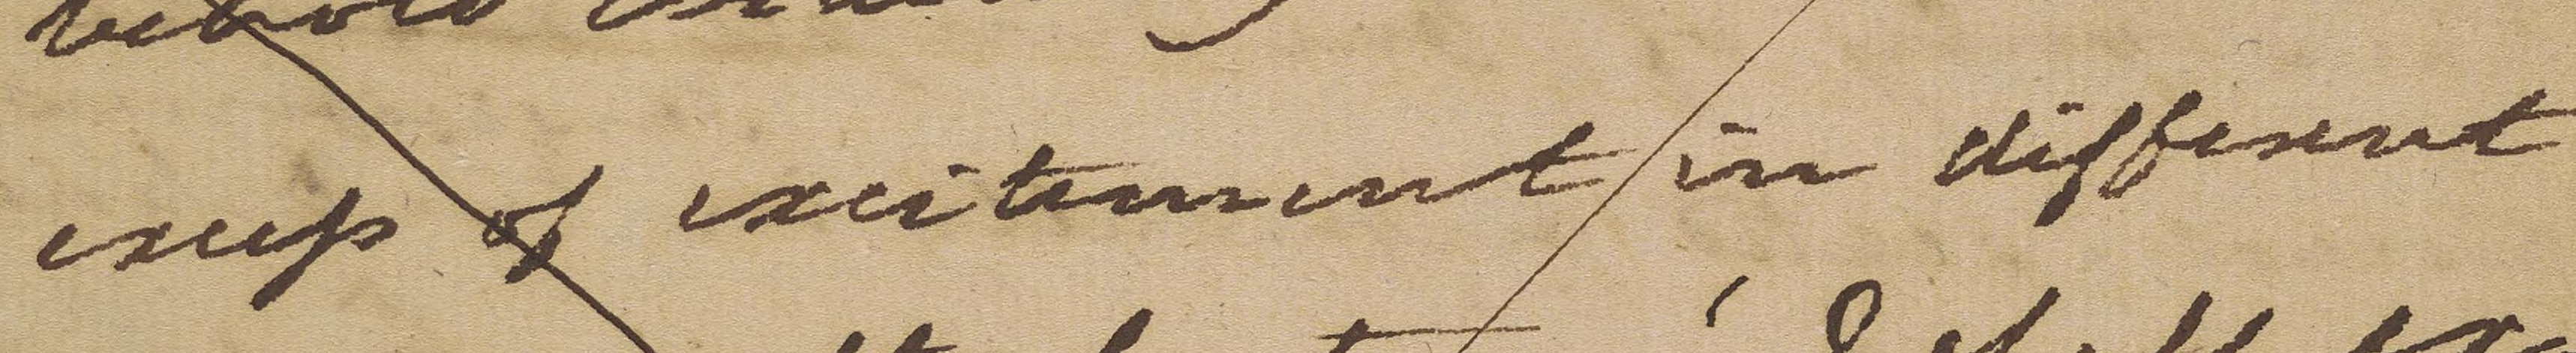excess of excitement in different
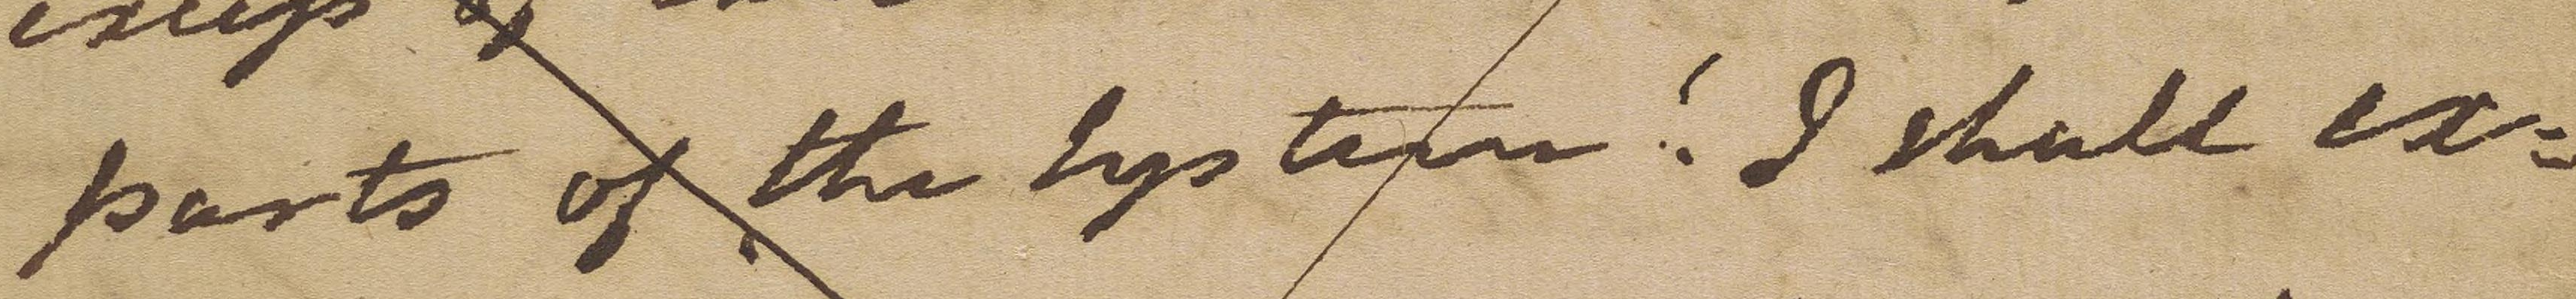parts of the system. I shall ex-
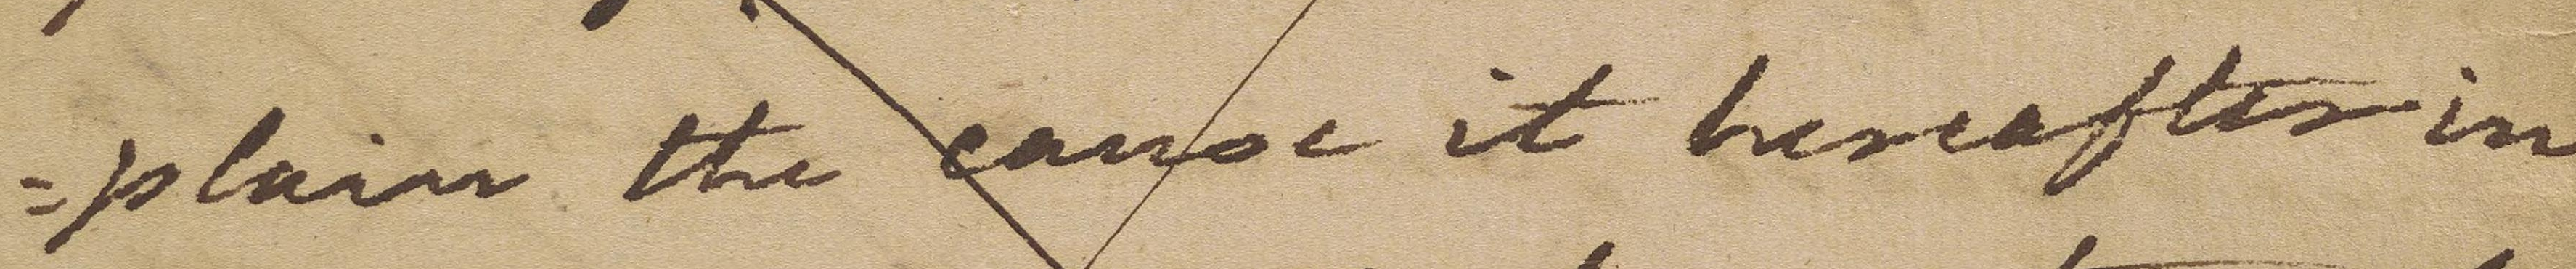-plain the cause it hereafter in
